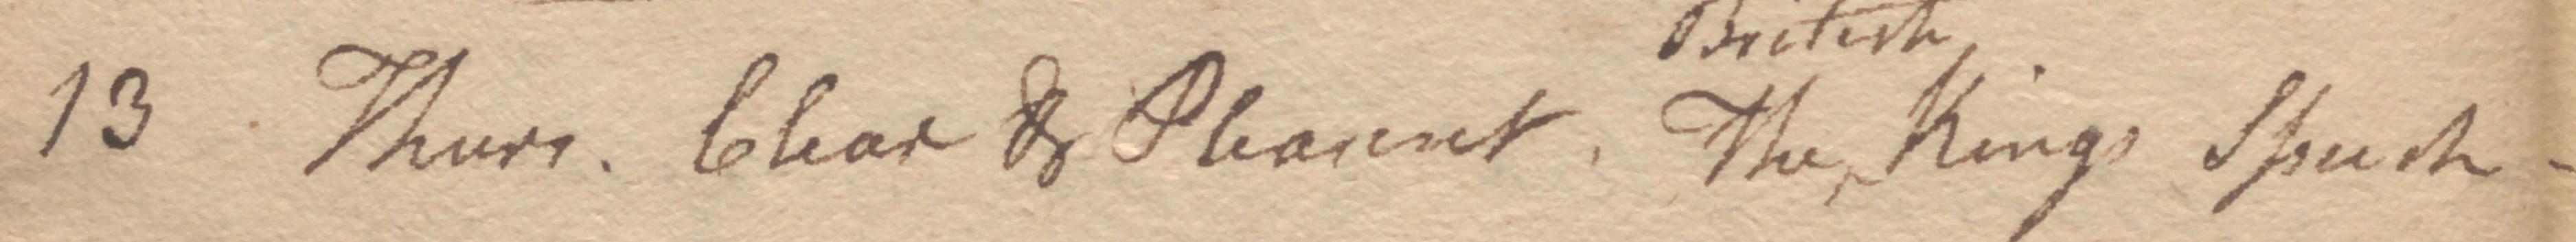13 Thurs. Clear & Pleasent. The ^ Kings Speech
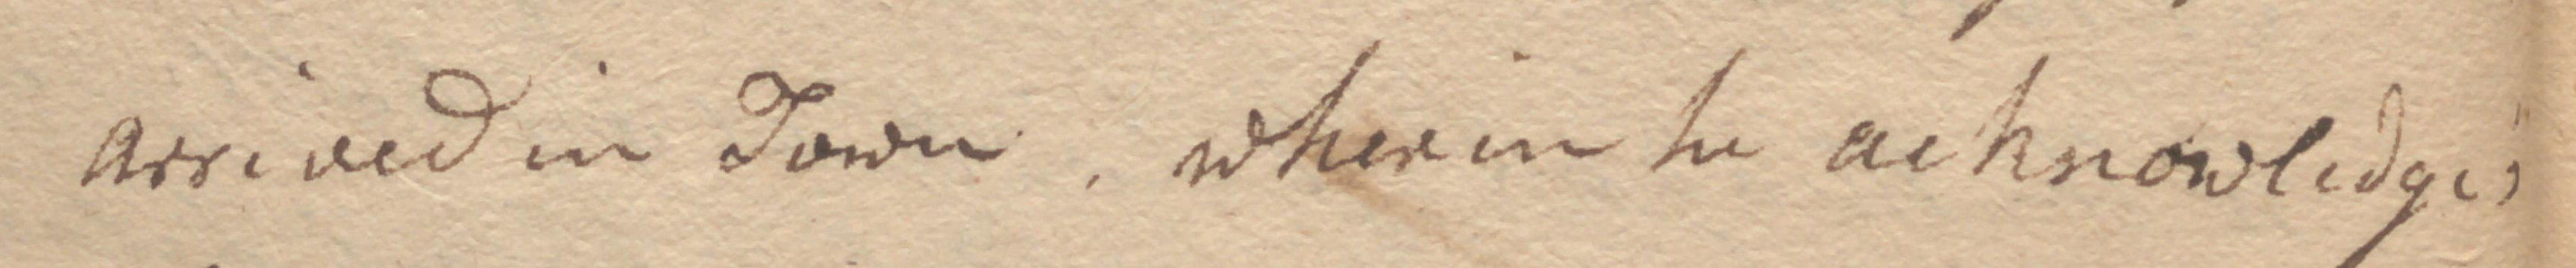Arrived in Town, wherin he acknowledges
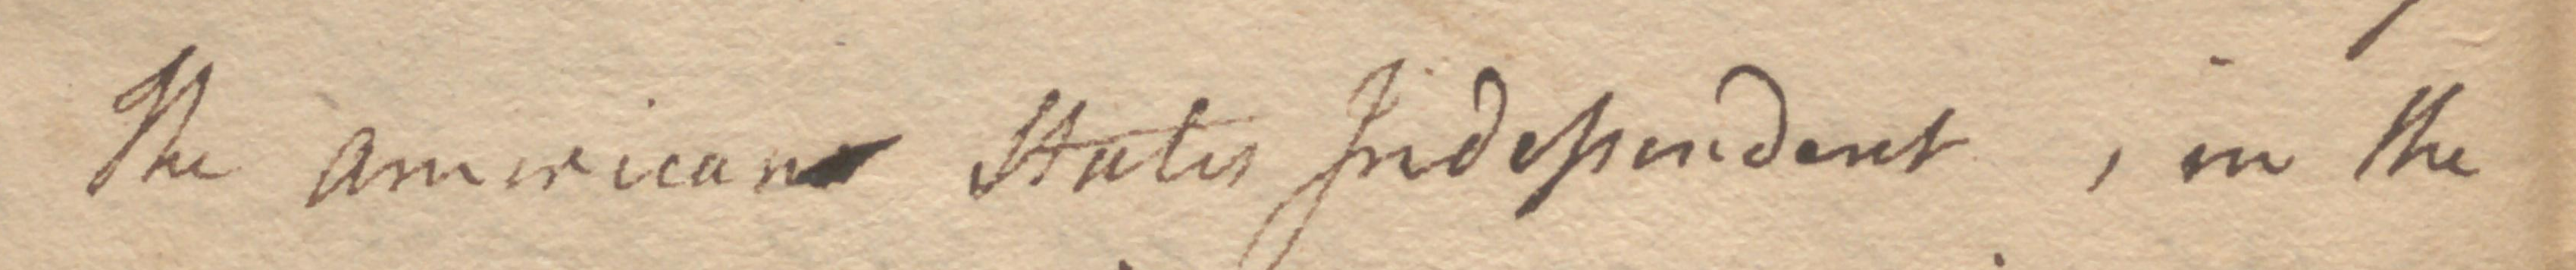The american States Independent, on the
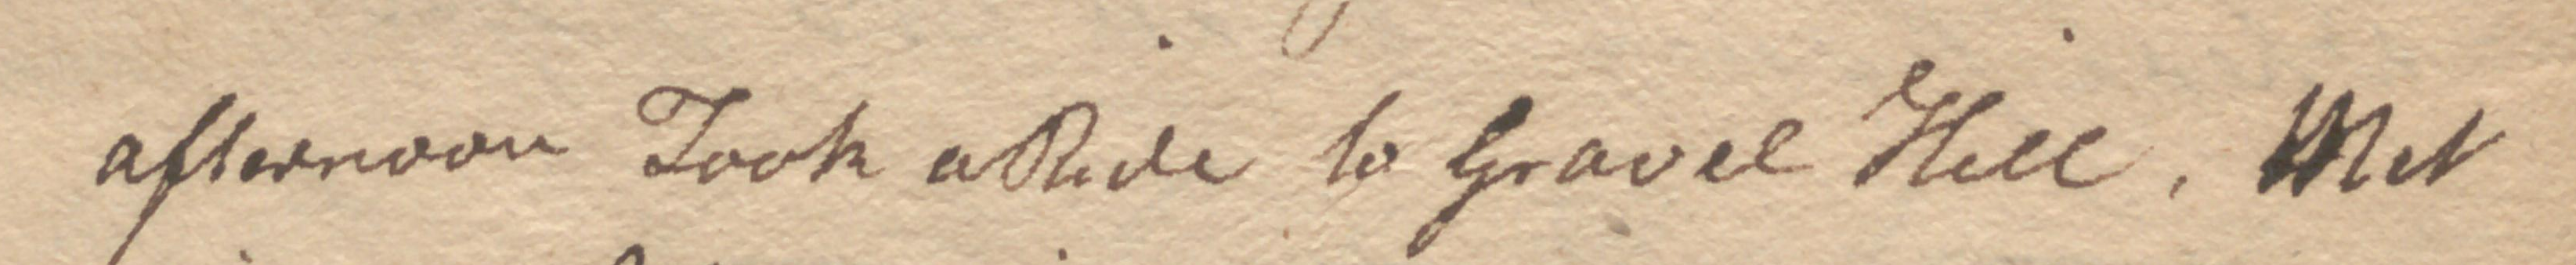afternoon Took a Ride to Gravel Hill, Met
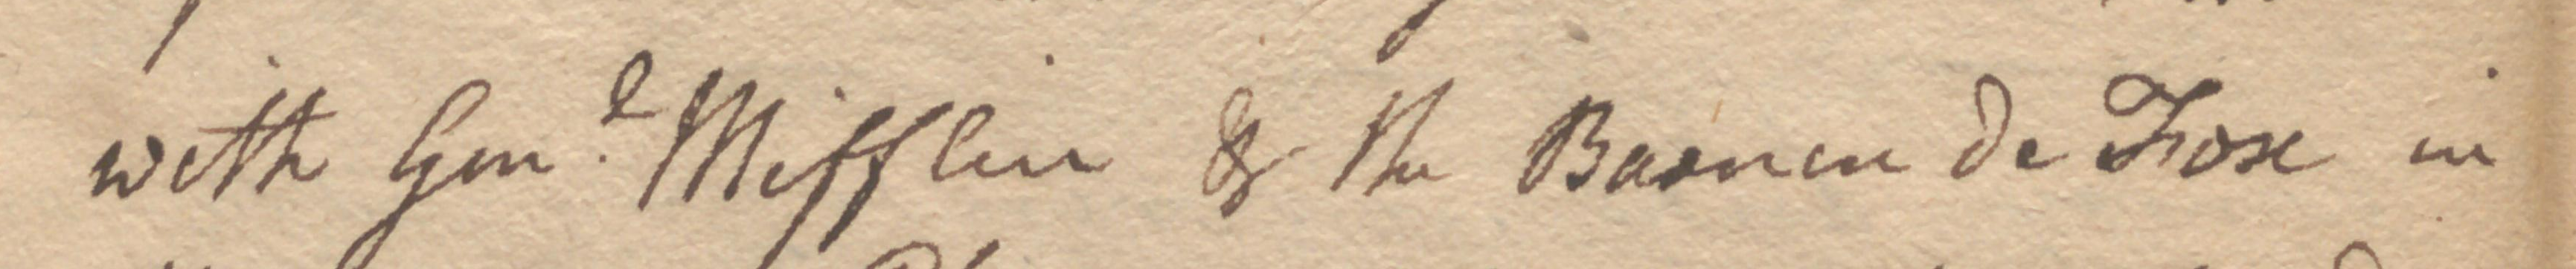with Gen^l. Mifflin & the Barner de Fox in
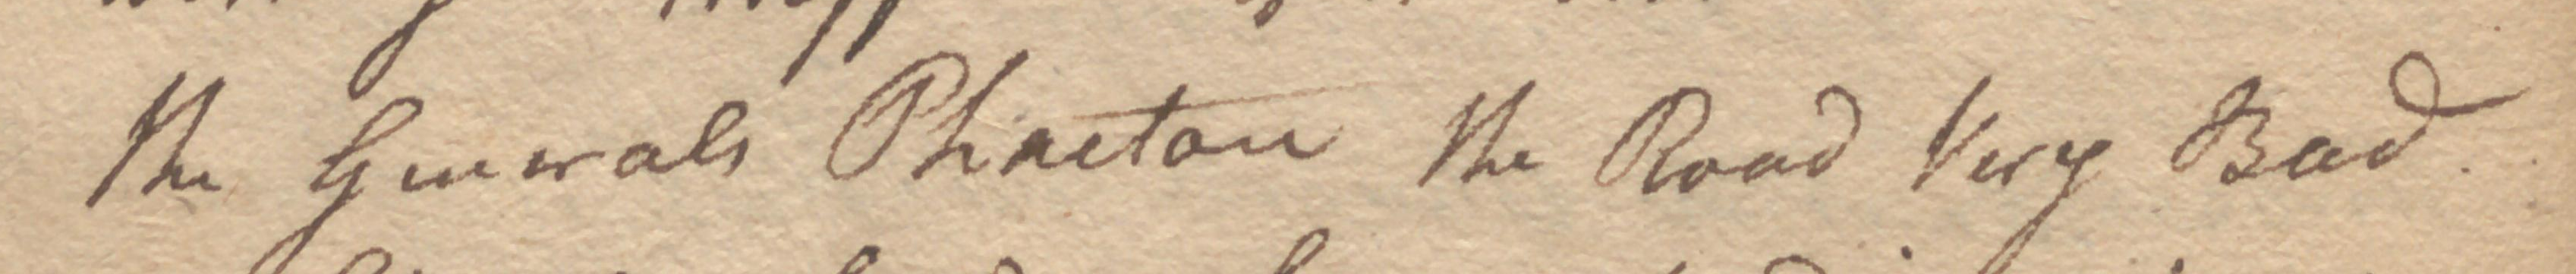the Generals Phaeton the Road Very Bad.
